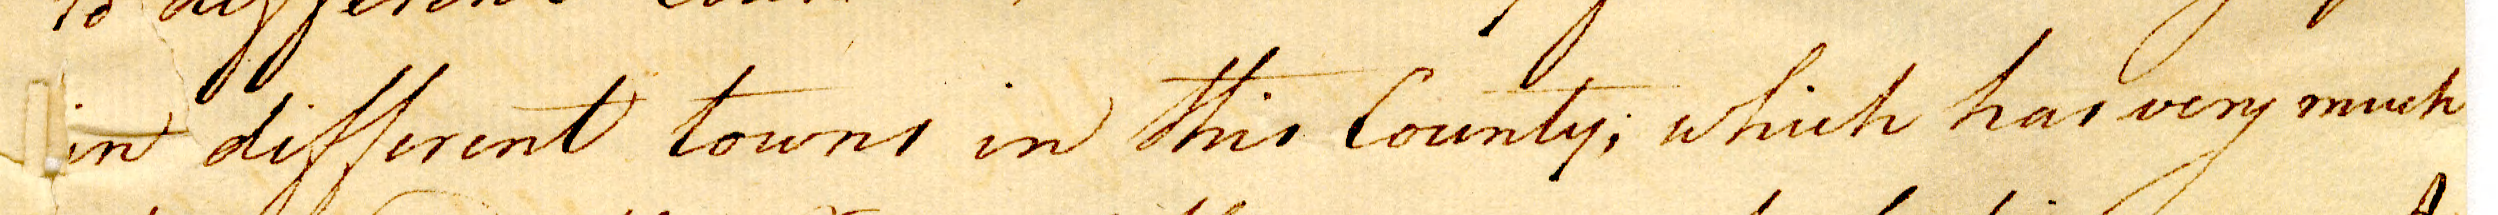in different towns in this County; which has very much
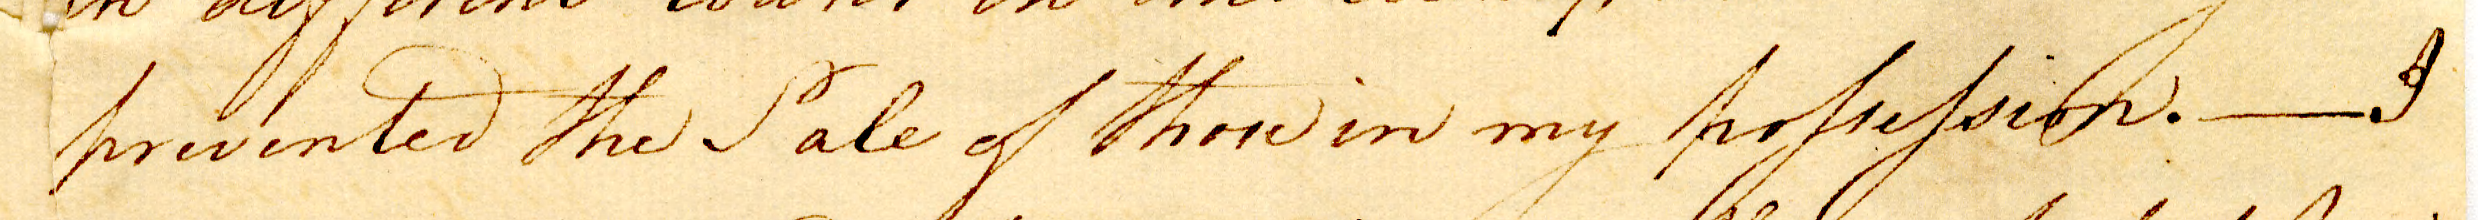prevented the Sale of those in my possession.- I
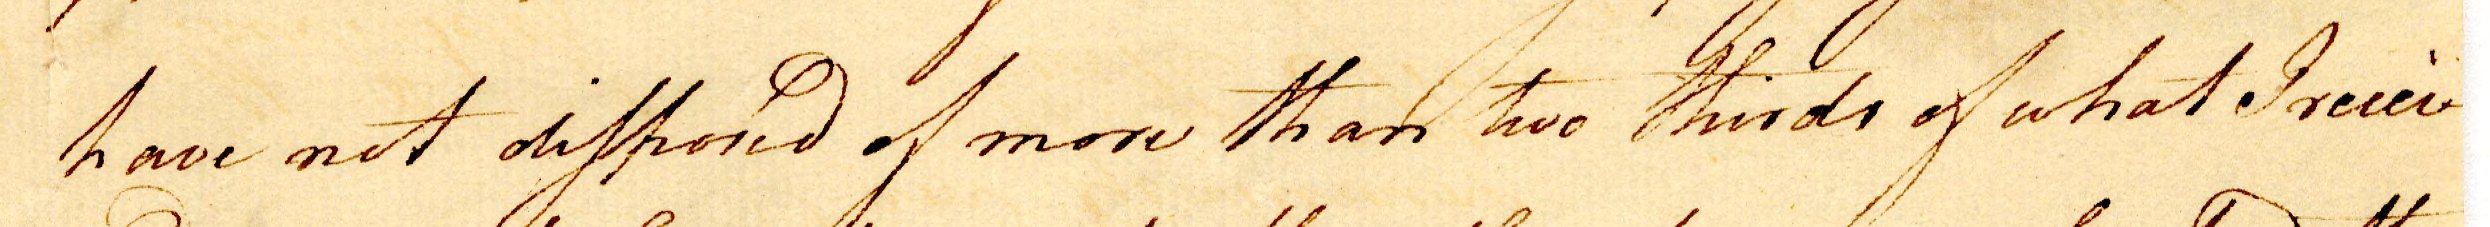have not disposed of more than two thirds of what I recei-
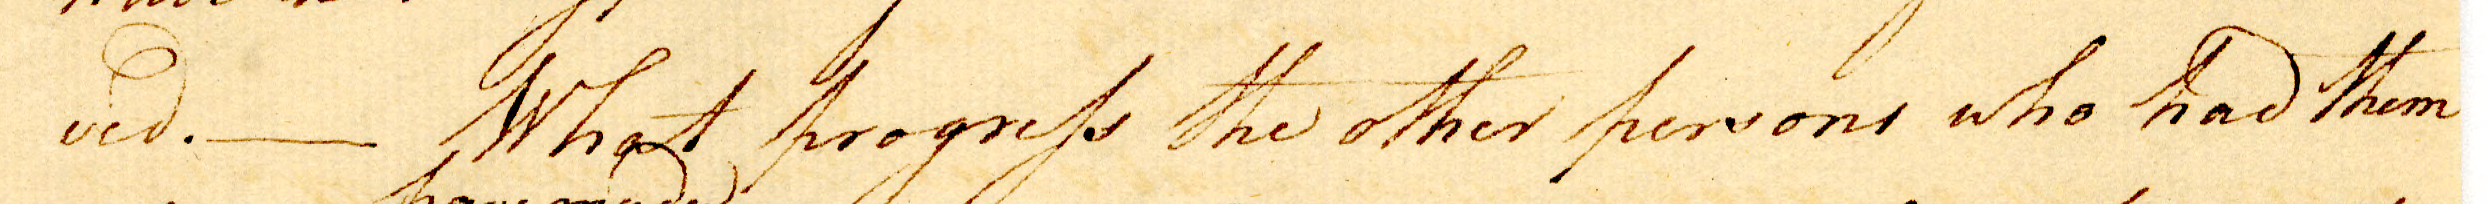ved.- What progress the other the other persons who had them
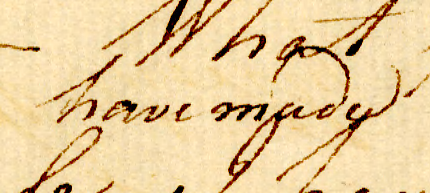have made
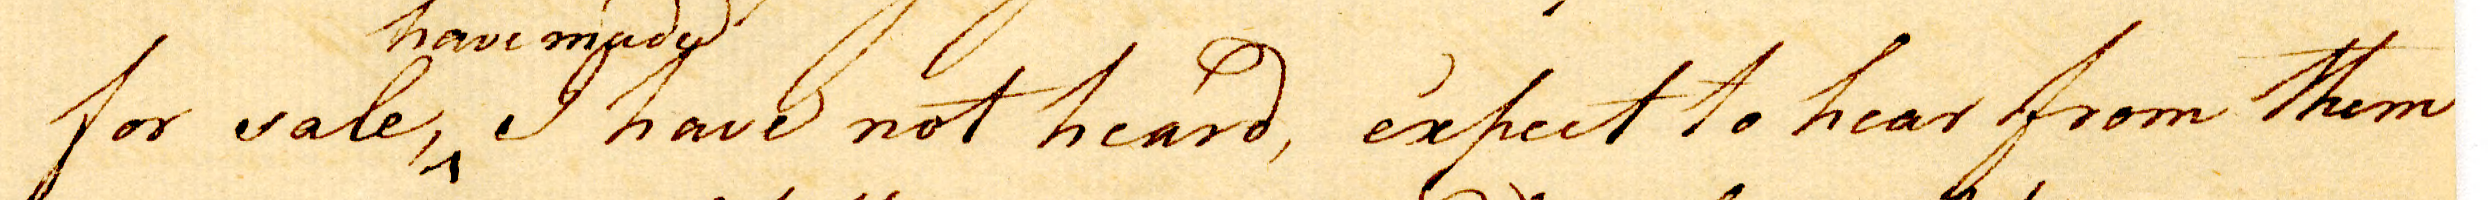for sale, ^ I have not heard expect to hear from them
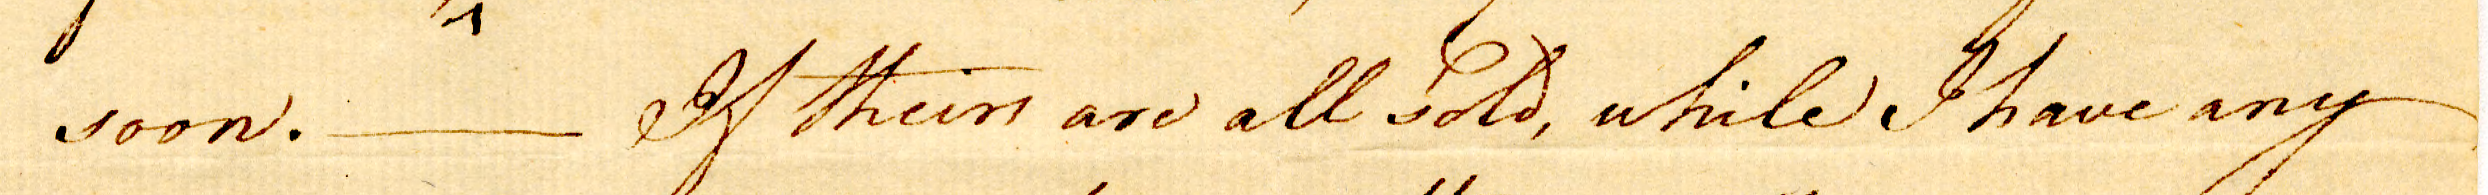soon.- If theirs are all sold, while I have any
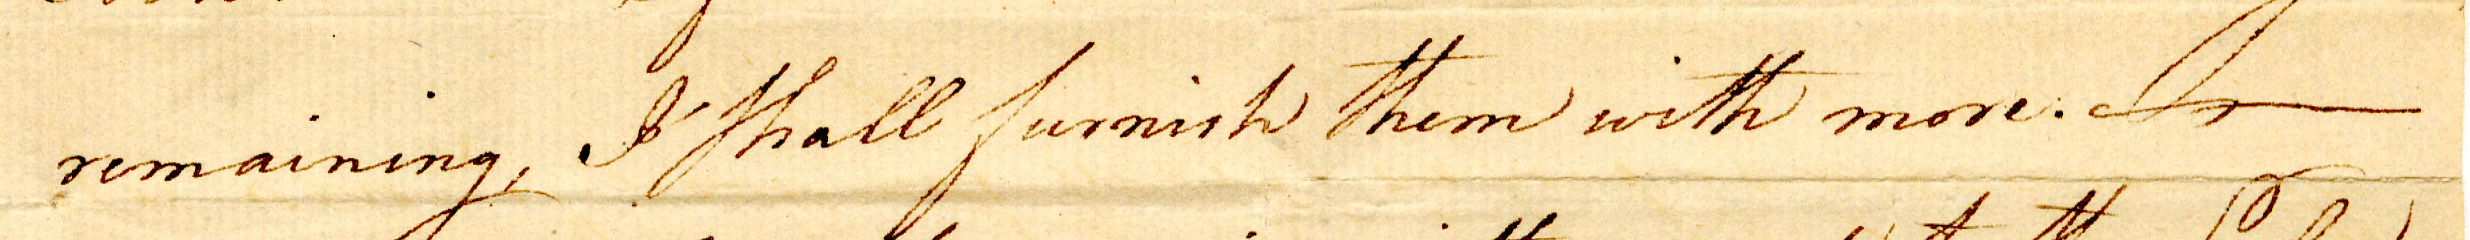remaining, I shall furnish them with more.-
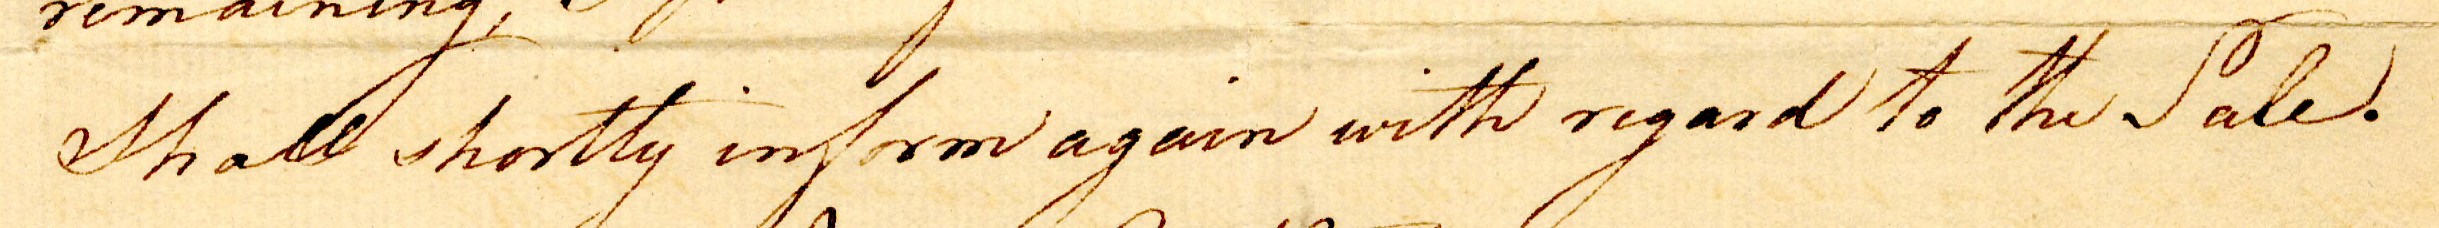Shall shortly inform again with regard to the Sale.
